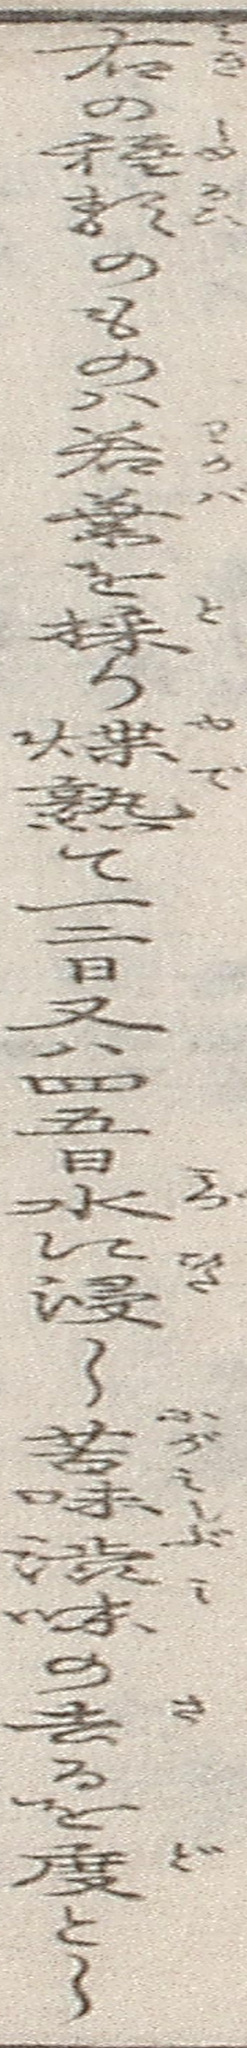右の種類のものは若葉を採り煠熟て一二日又は四五日水に浸し苦味渋味の去るを度とし
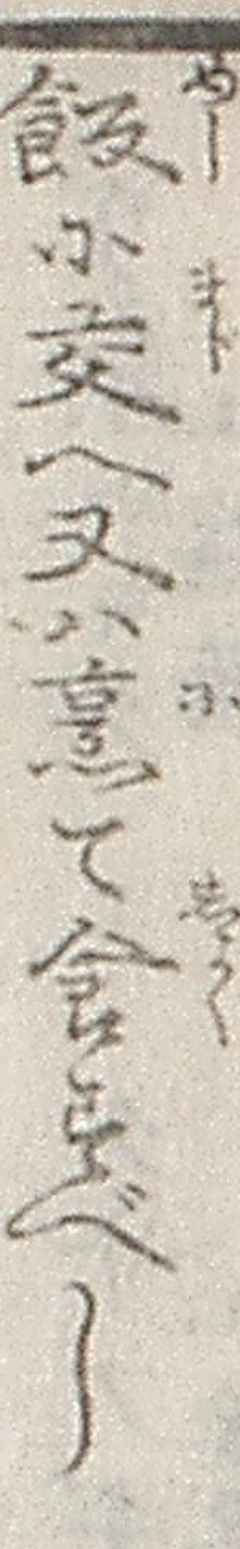飯に交へ又は烹て食すべし

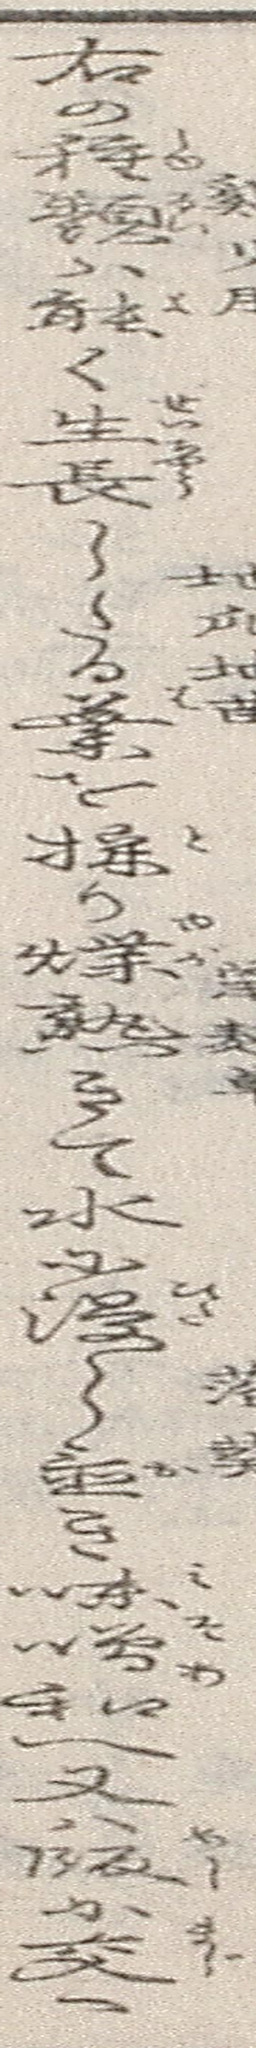右の種類は能く生長したる葉を採り煠熟きて水に浸し置き味噌和へ又は飯に交へ
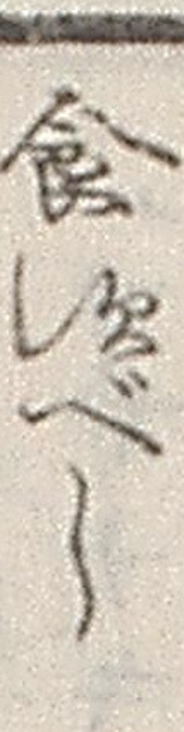食すべし
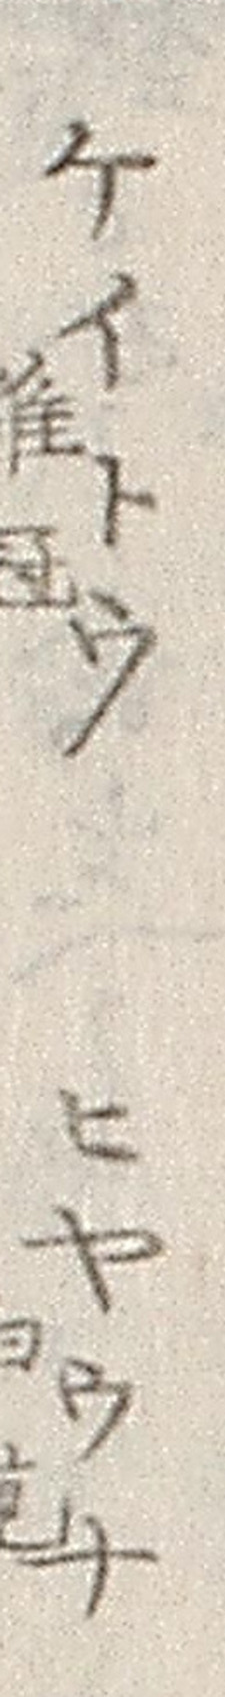ケイトウヒヤウチ
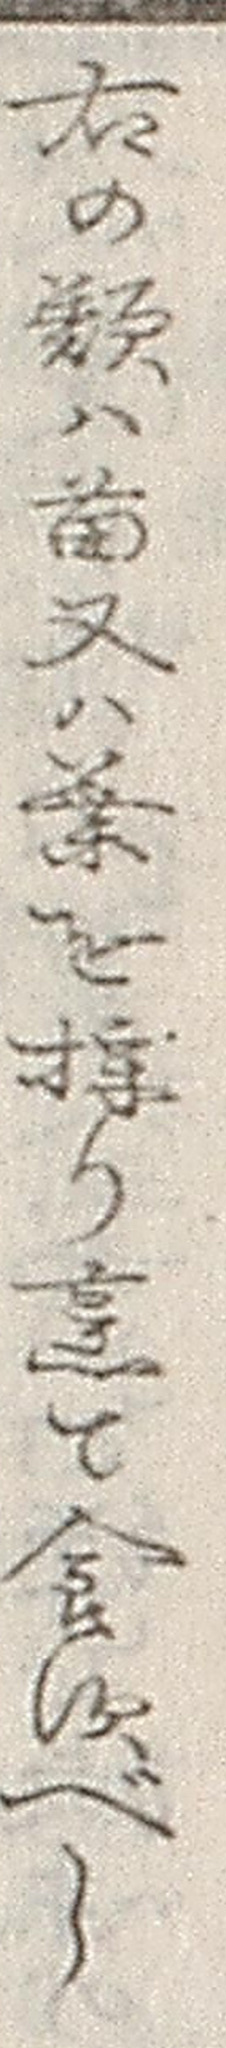右の類は苗又は葉を採り烹て食すべし
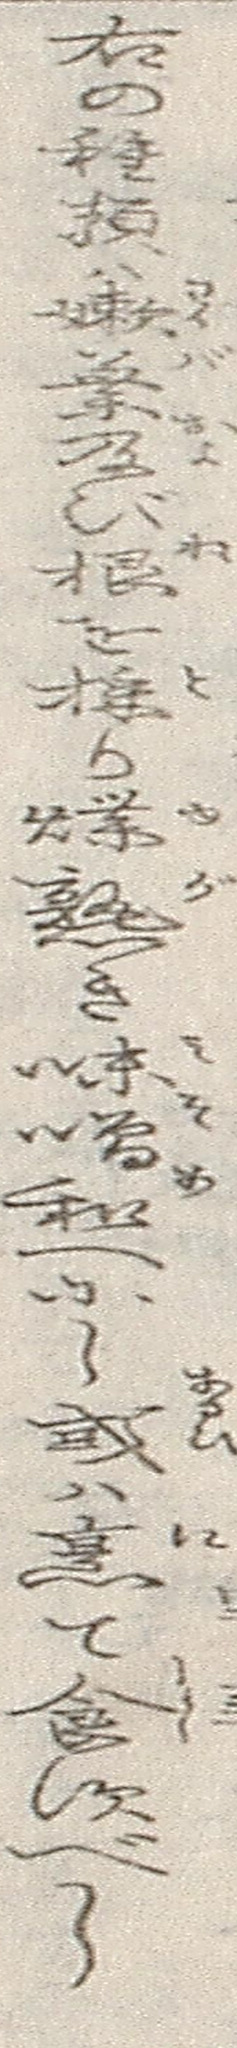右の種類は嫩葉及び根を採り煠熟き味噌和へにし或は烹て食すべし
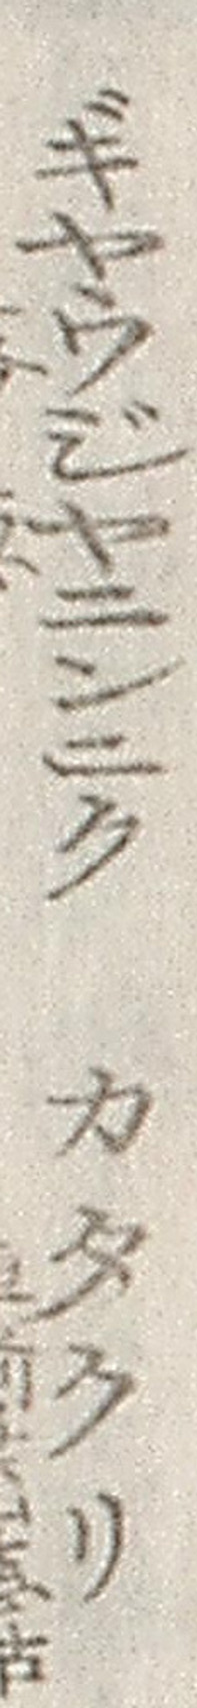ギヤウジヤニンニクカタクリノビル
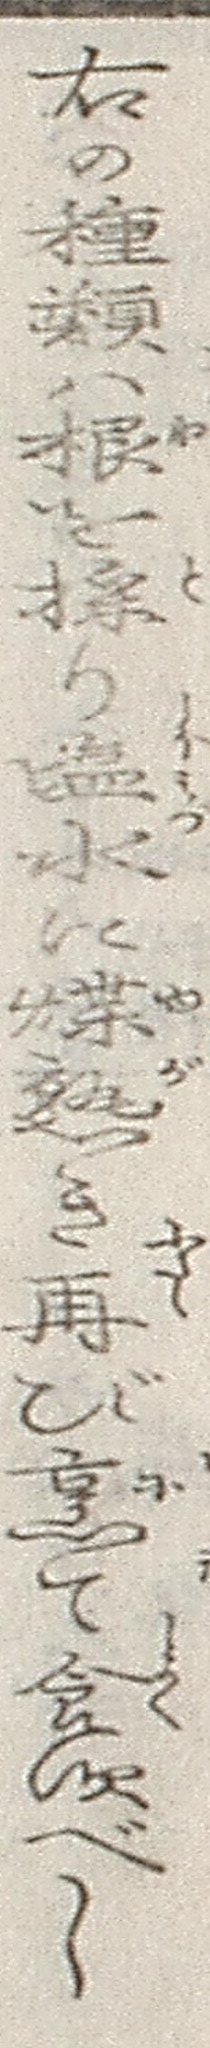右の種類は根を採り塩水に焼熱き再び烹て食すべし
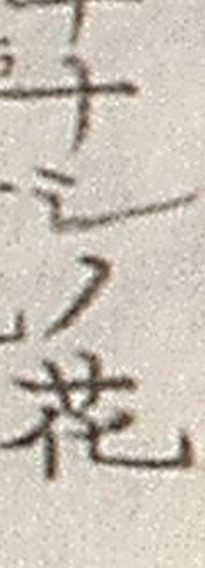ケシノ花
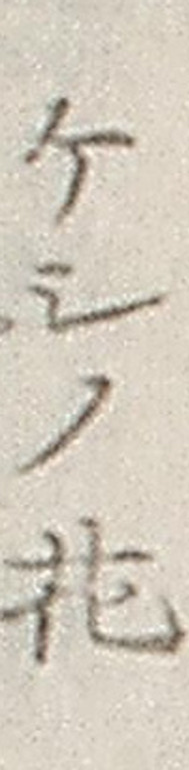ケシノ花
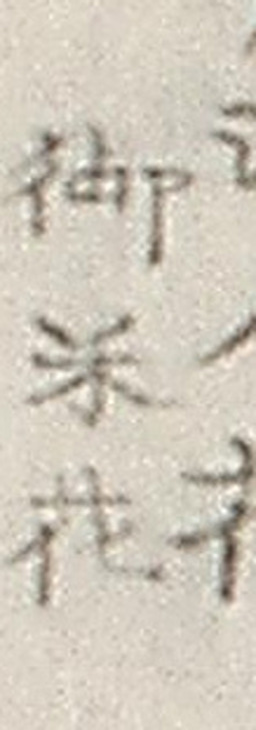御米花

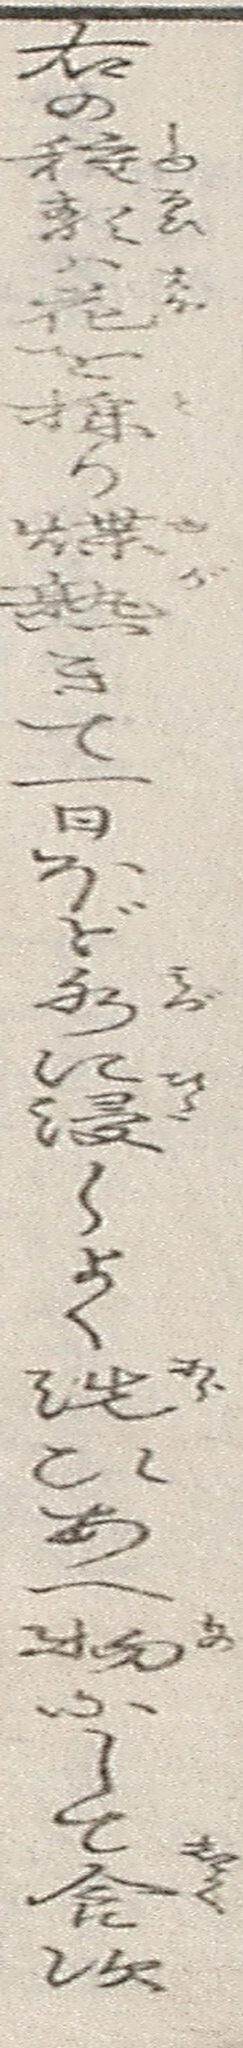右の種類は花を採り煠熟きて一日ほど水に浸しよく洗ひあへ物にして食す
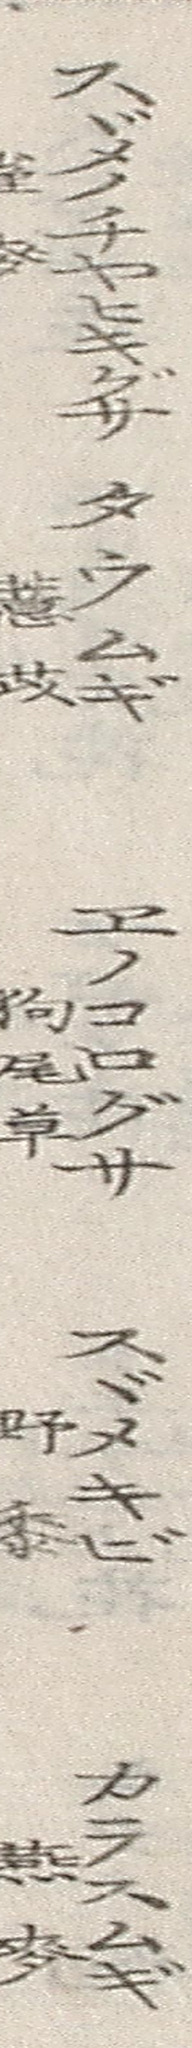スヾメノチヤヒキグサタウムギエノコログサスヾメキビカラスムギ
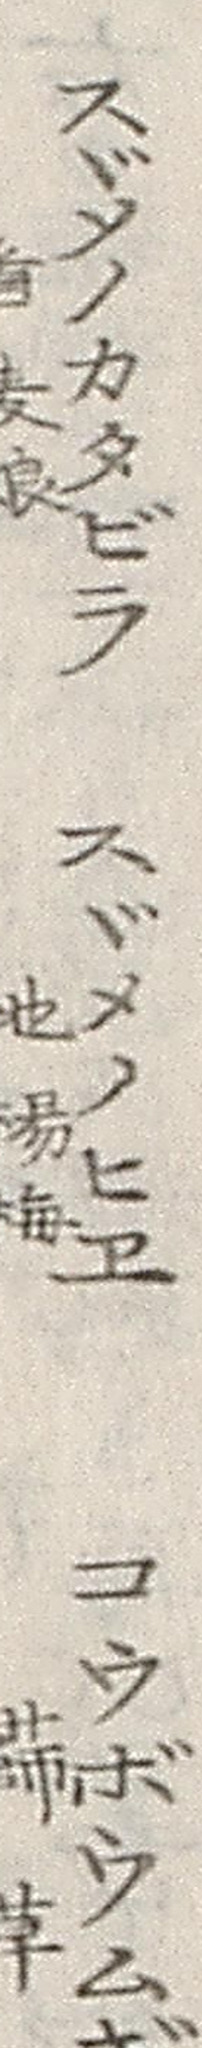スヾメノカタビラスヾメノヒエコウボウムギ
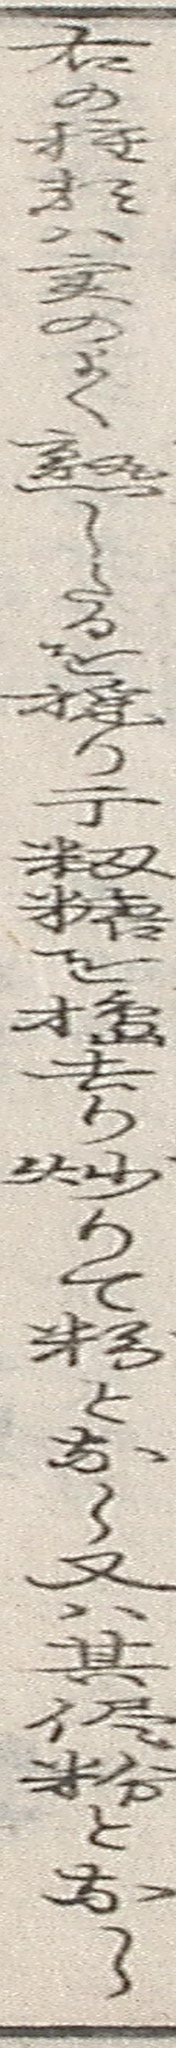右の種類は実のよく熟したるを採り干籾糠を搗去り炒りて粉となし又は其侭粉となし
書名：凶荒図録　完
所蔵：東京大学地震研究所図書室 Earthquake Research Institute Library, The University of Tokyo, JAPAN
